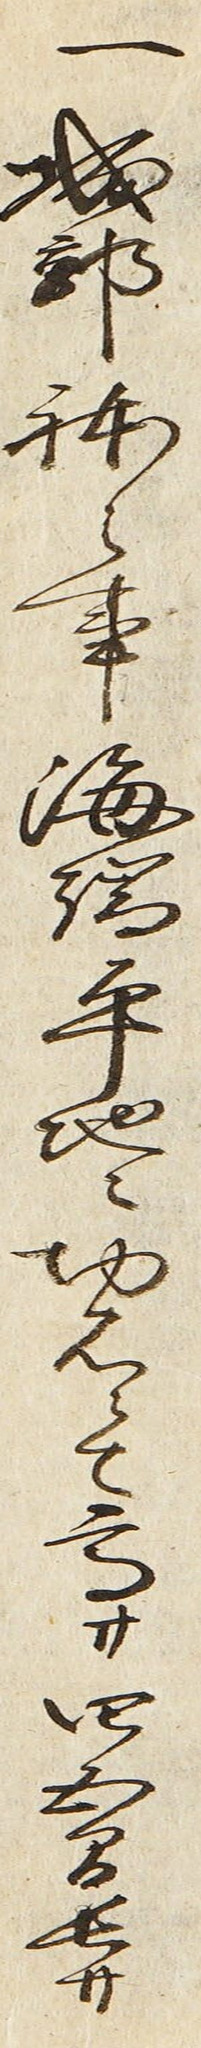一城郭躰之事海端平地に切石にて高さ四五間長さ
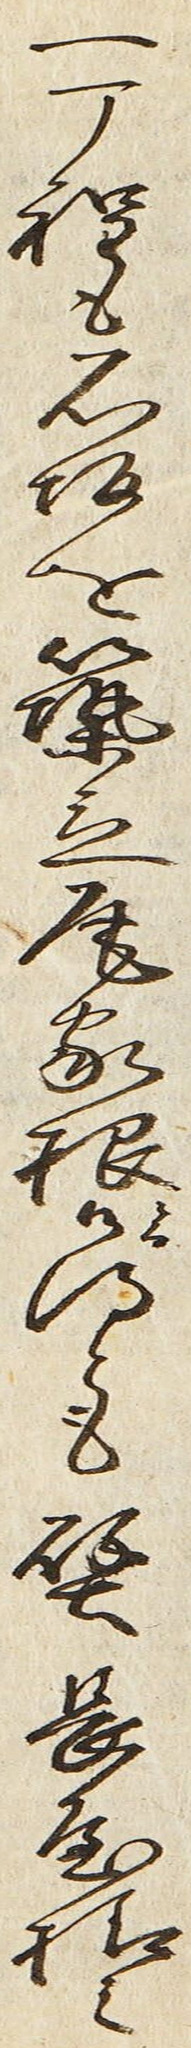一丁程も石垣を築立瓦屋根に而候得とも壁長屋様之
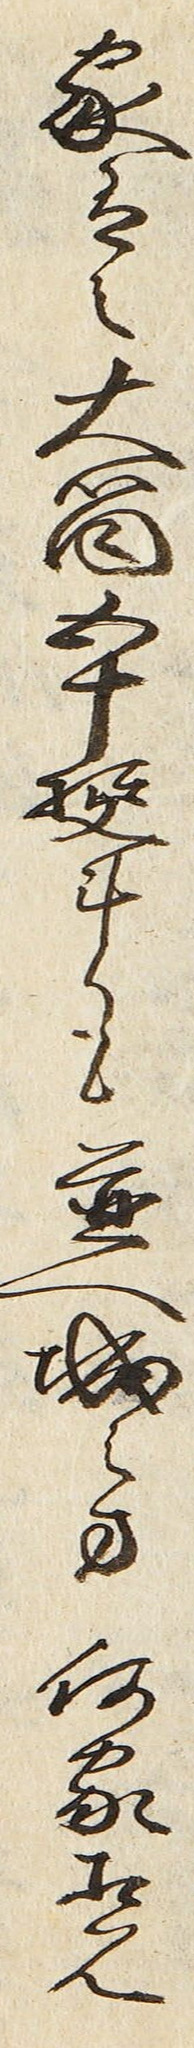家有之大筒五十帳挺計も並へ城之方何家相見
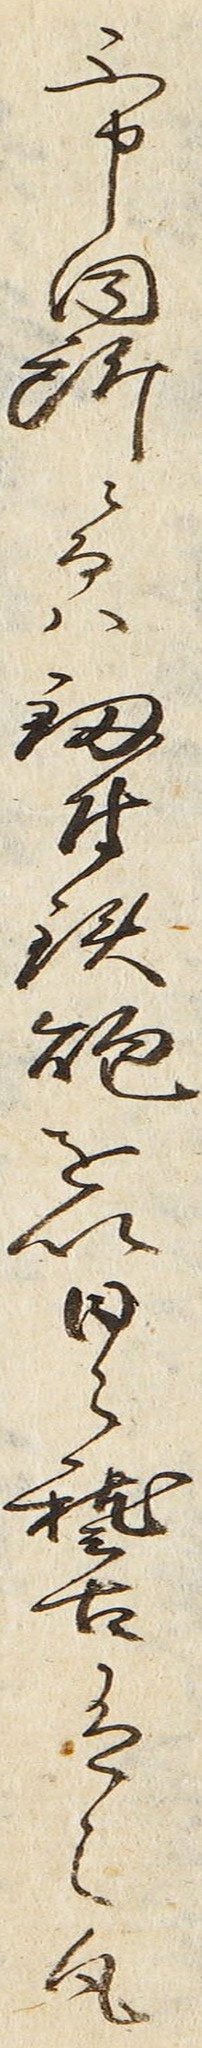不申同所に而は釼付鉄砲を以日々稽古有之凡
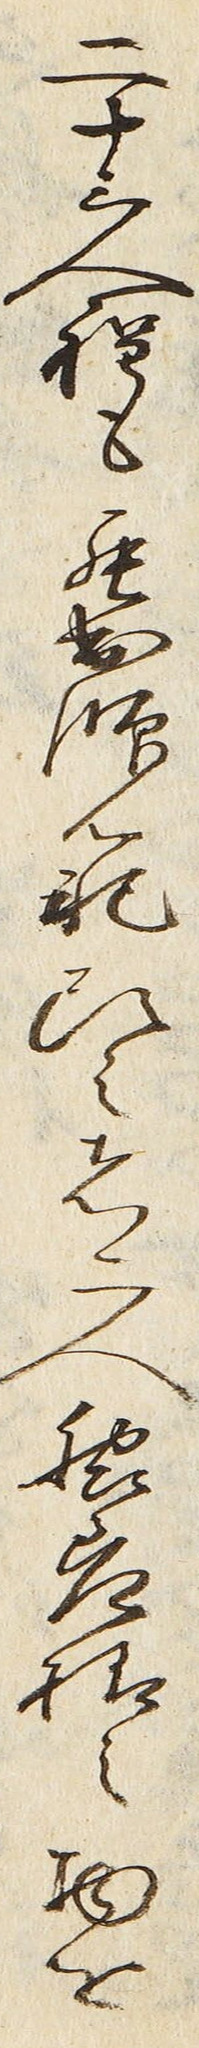二十三人程も罷出師範頭之者二人脇差様之物を
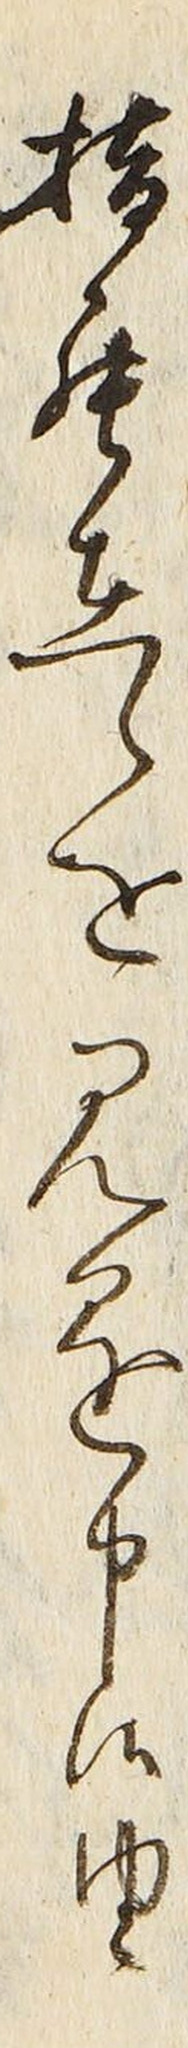指罷在候を見懸申候由
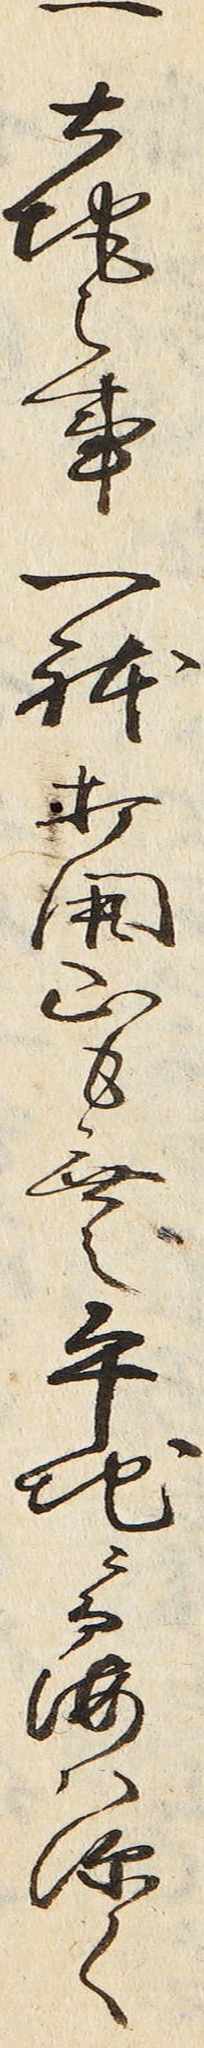一土地之事一躰打開山も無之平地に而海は深く
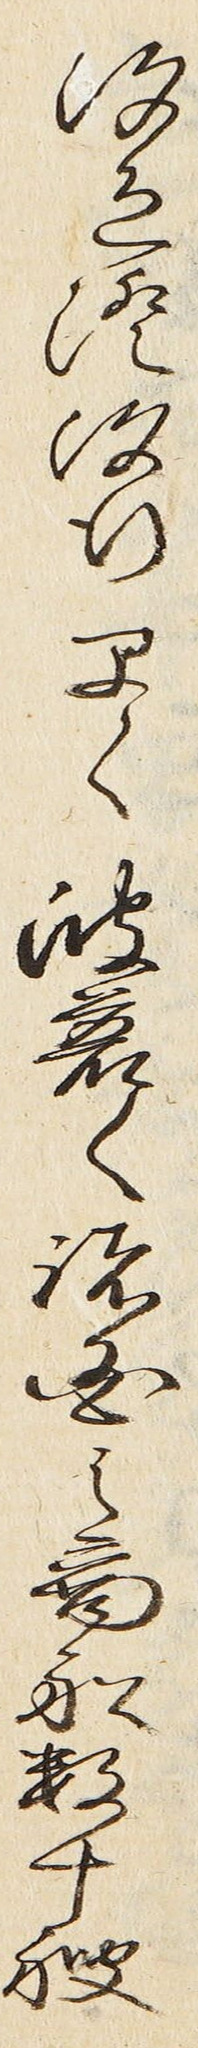汐色澄汐行早く波荒く諸国之商船数十艘
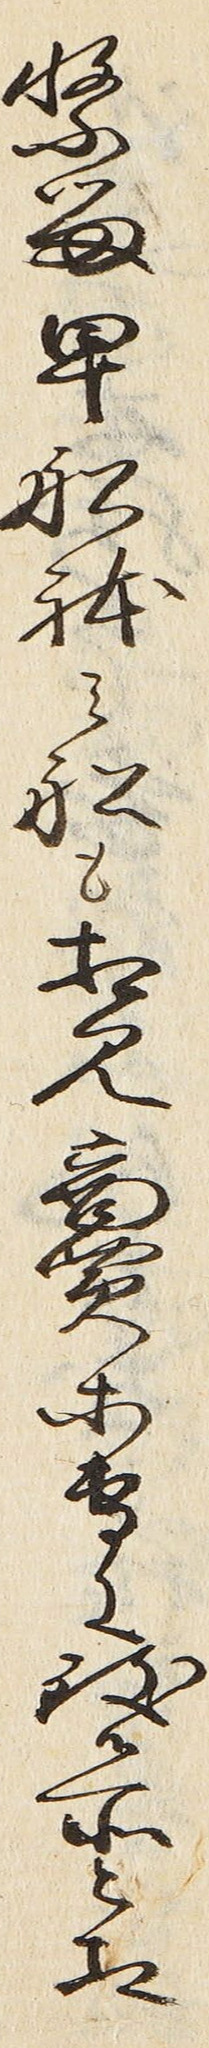繋留早船躰之船も相見商売等専に致候所と相
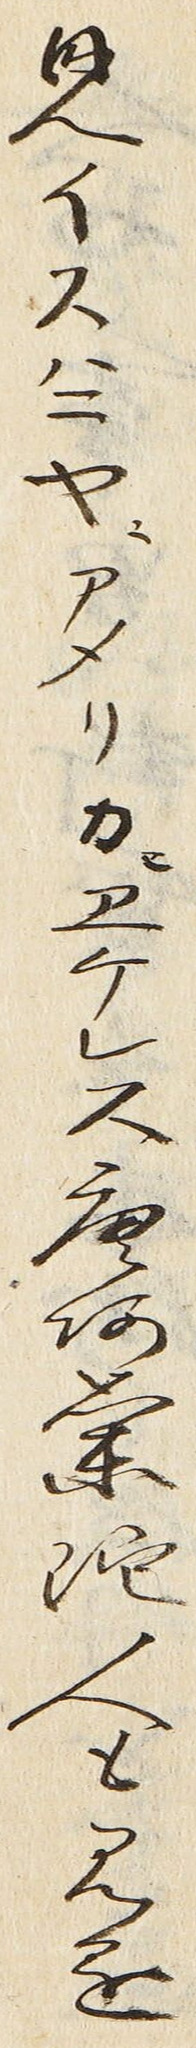見イスハニヤにアメリカにエケレス唐阿蘭陀人も見懸
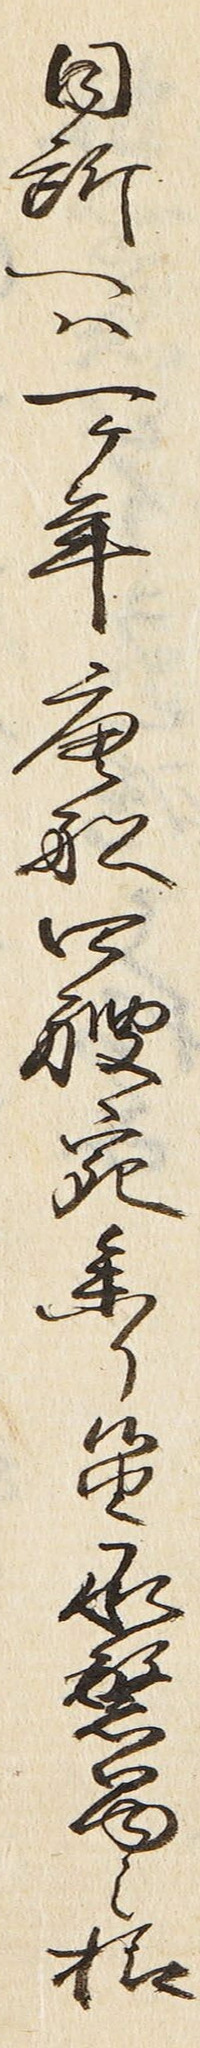同所へは一ヶ年唐船四艘宛参り候由永繋留之様
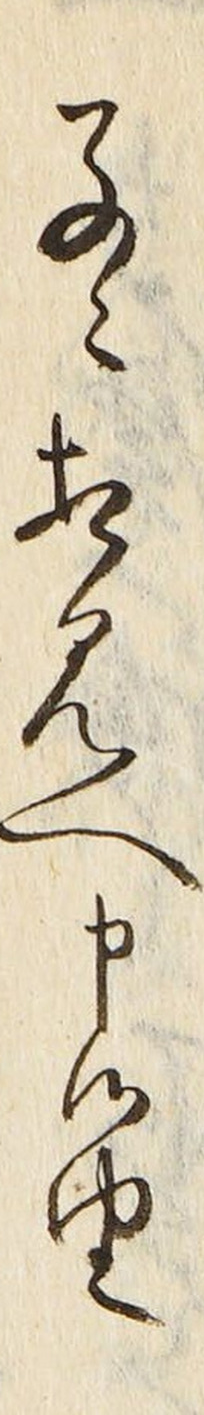子に相見へ申候由
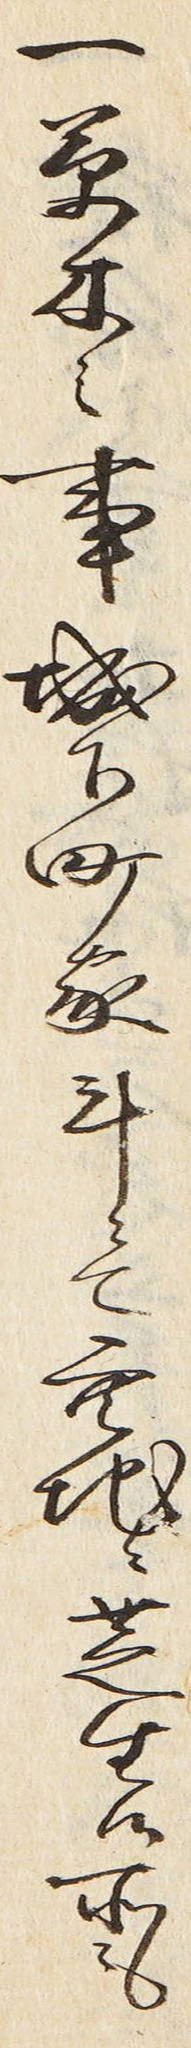一草木之事城下町家計にて空地に芝生候所も
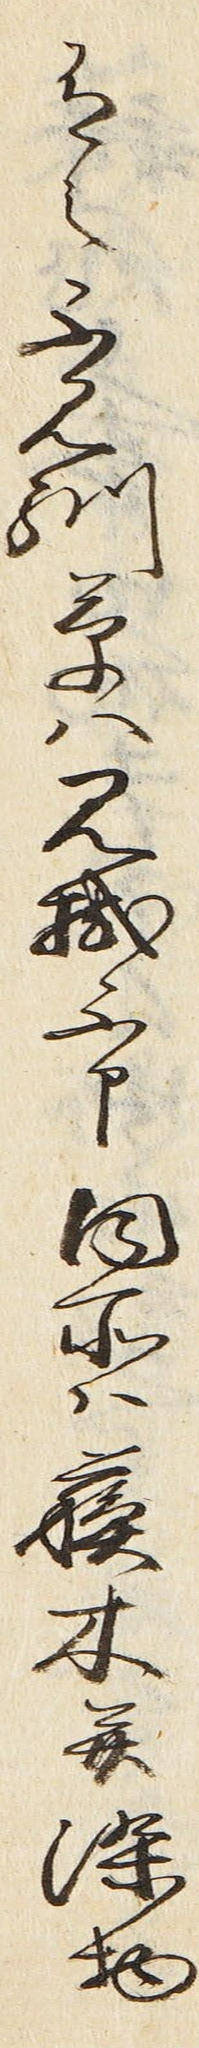有之譜不見馴草は見掛不申同所は蘇木并染物
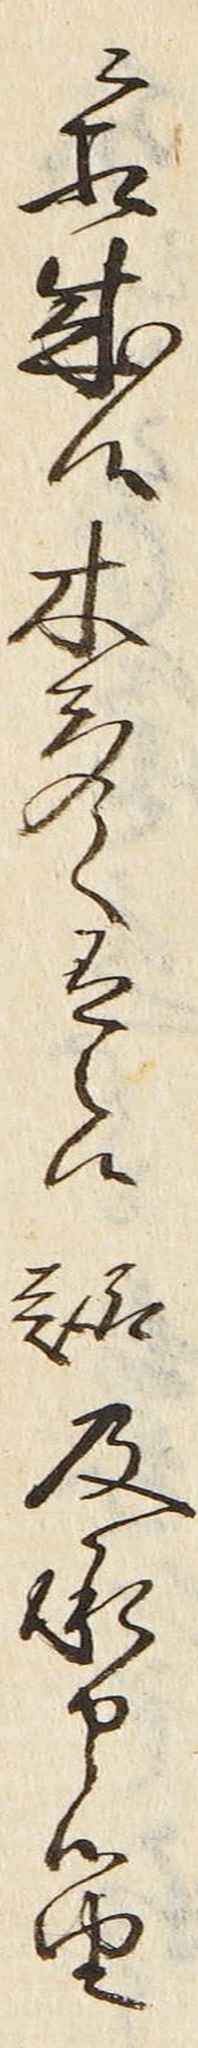に相成候木多く有之候趣及承申候由
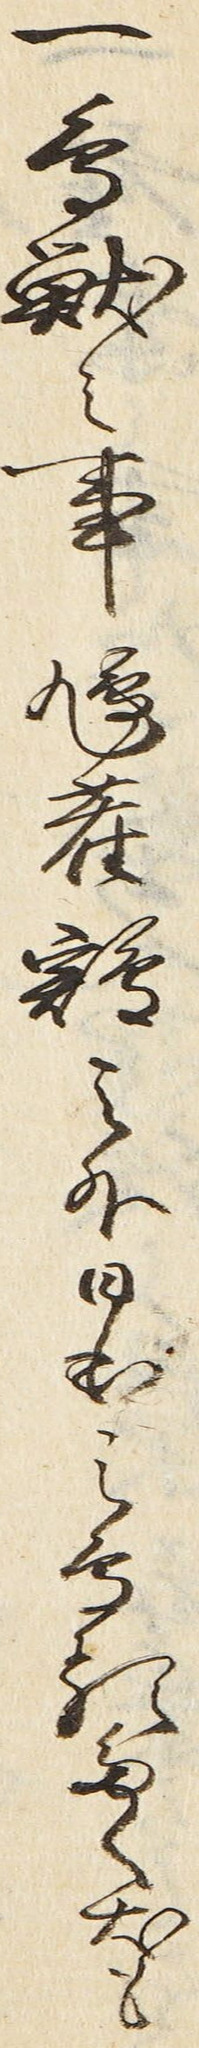一鳥獣之事鳩雀鶏之外日本之鳥類多く犬も
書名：土佐中浜万次郎漂流記
